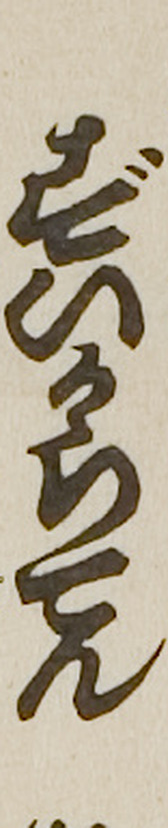ずいからてん
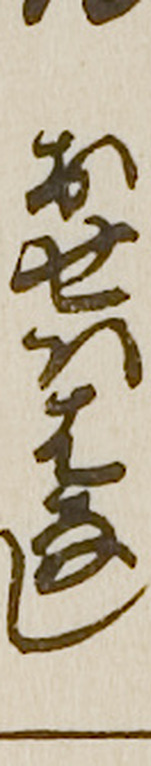おせははなし
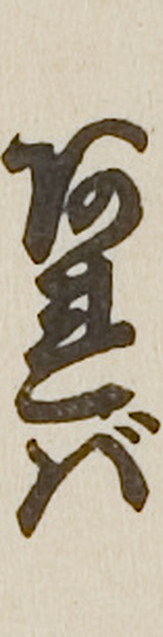あれば
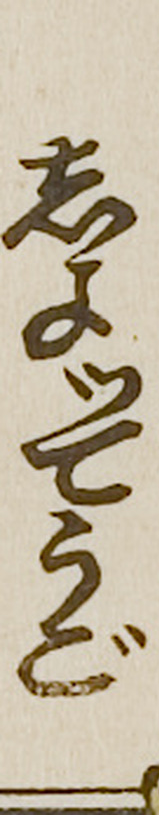しよってうご
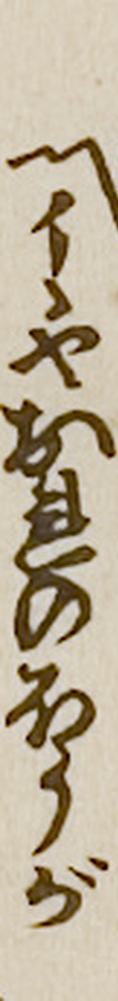〽イゝヤおれのほうが
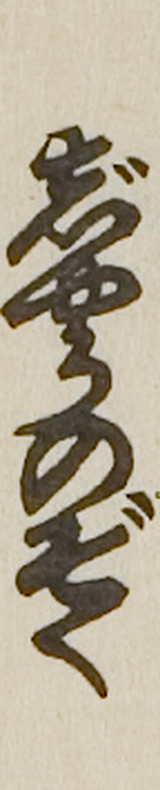じやうのぞく
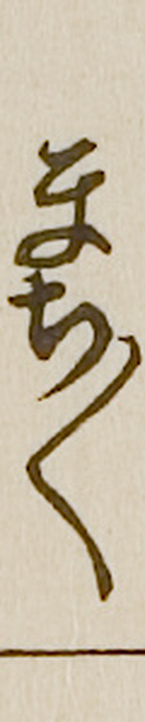まち〳〵
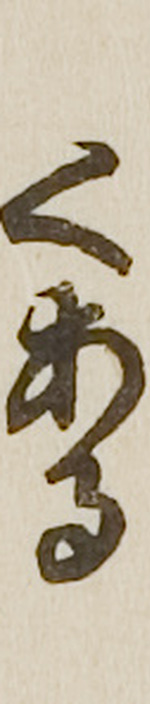くある
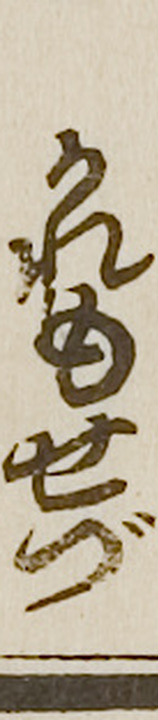かれもせづ
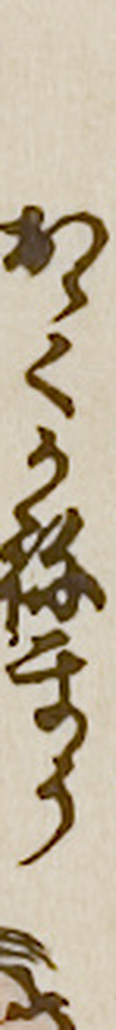おゝくかねまう
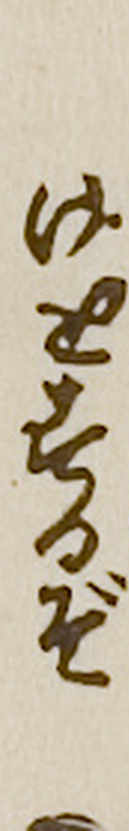けをするぞ
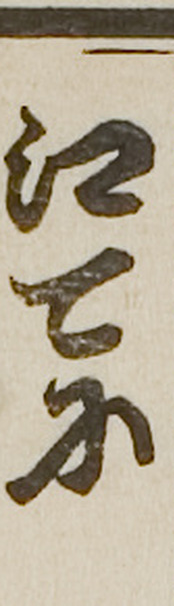えてに
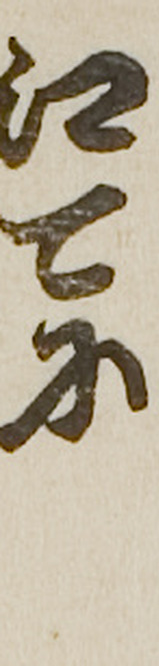えてに
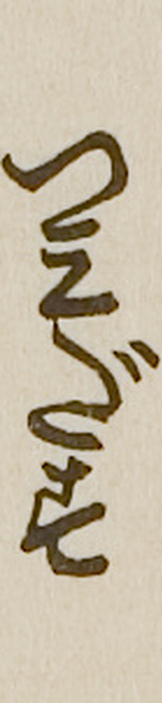つみだす
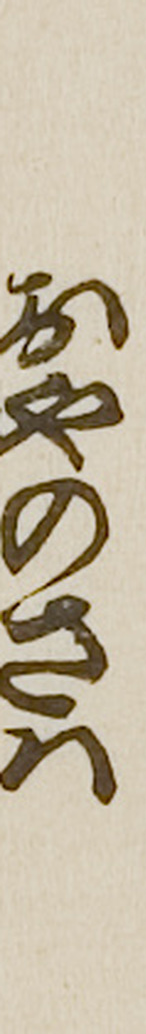おやのさは
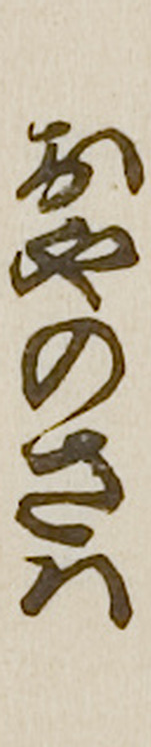おやのさは
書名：当時流行いろは壁
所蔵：東京大学総合図書館 General Library in the University of Tokyo, JAPAN
